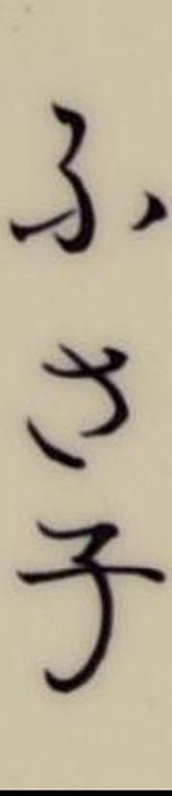ふさ子
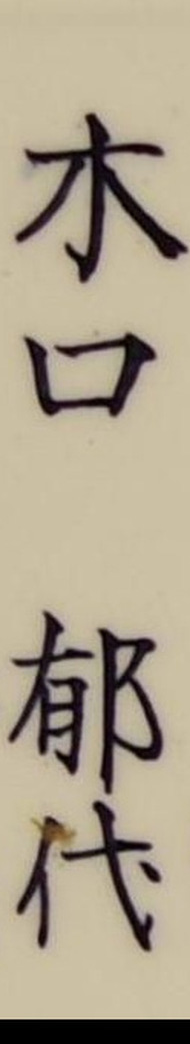木口都代
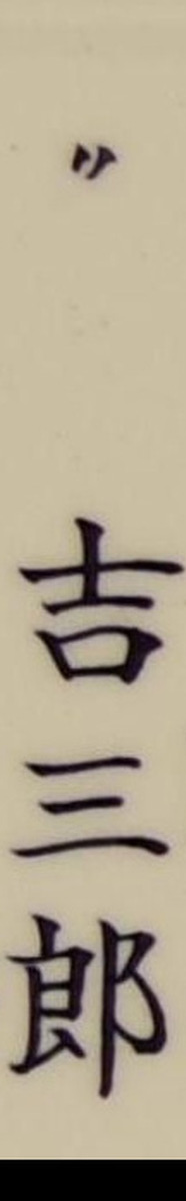吉三郎
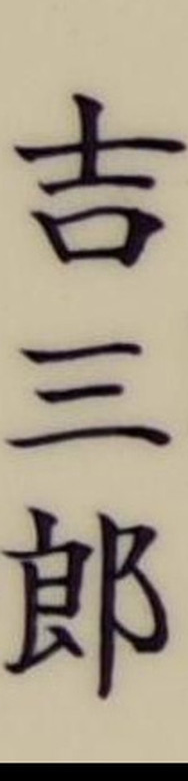吉三郎
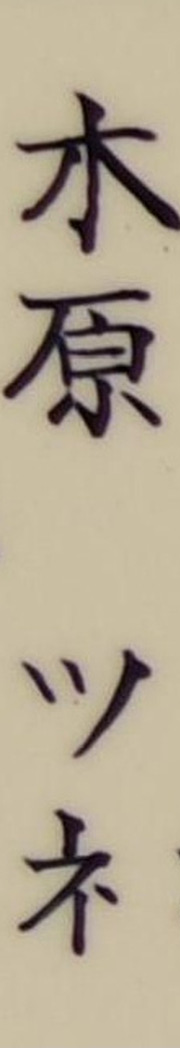木原ツネ
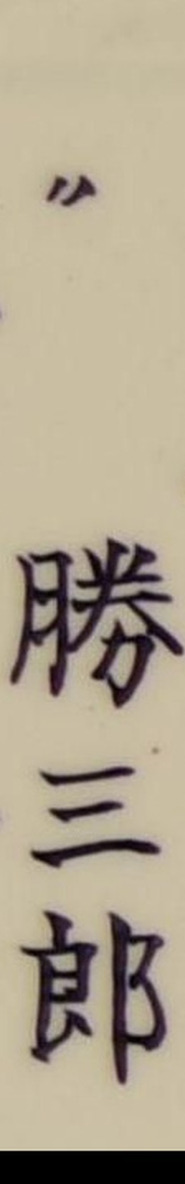勝三郎
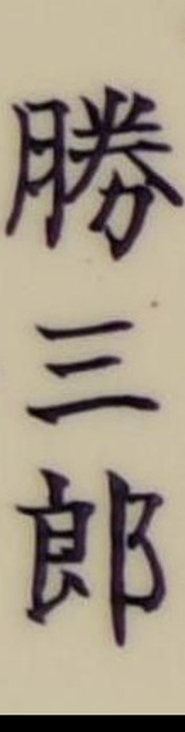勝三郎
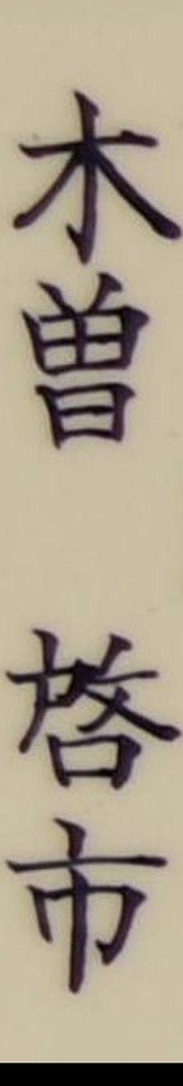木曽啓市
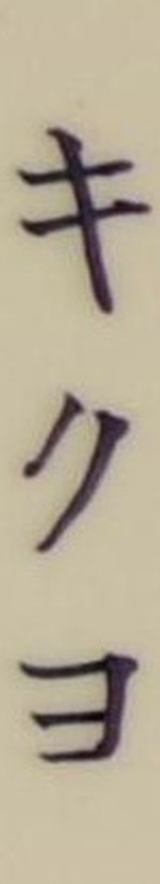キクヨ
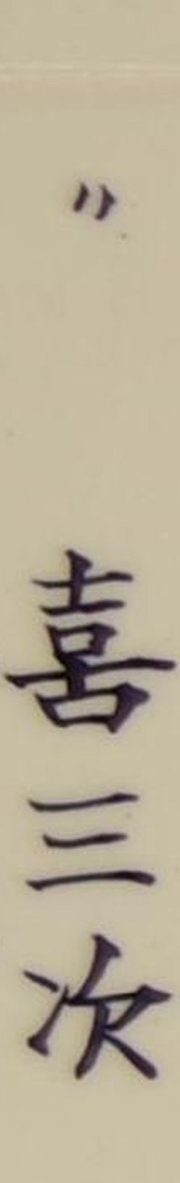喜三次
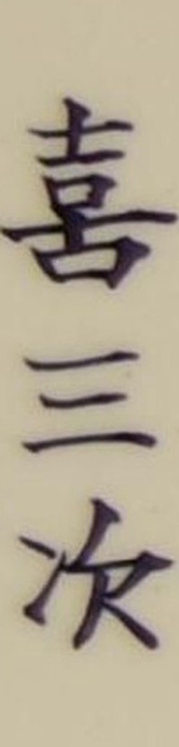喜三次
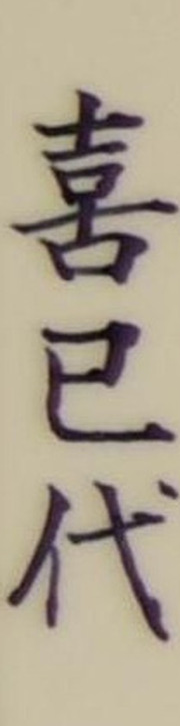喜巳代

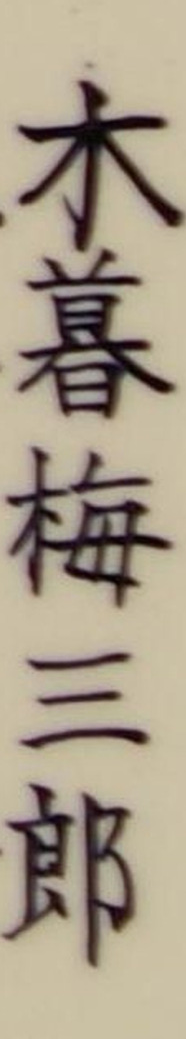木暮梅三郎
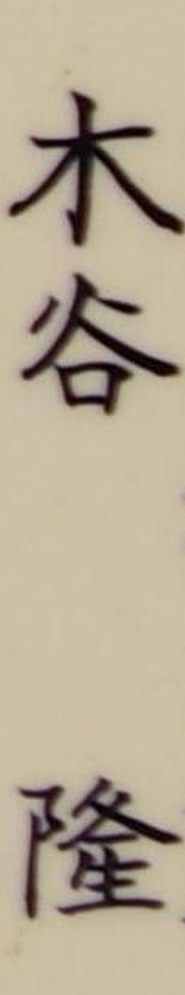木谷隆
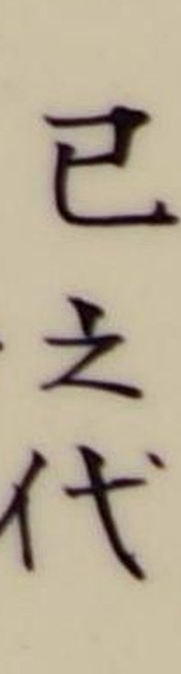巳之代
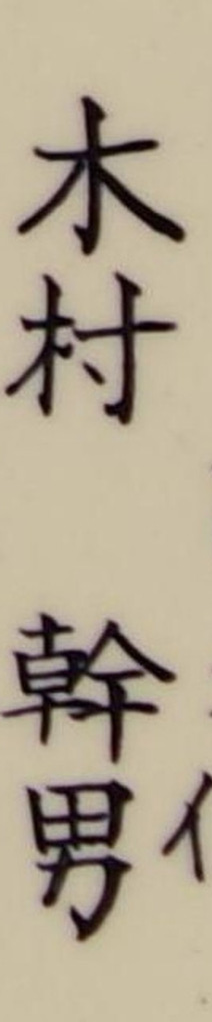木村幹男
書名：E~L
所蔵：高野山金剛峯寺
